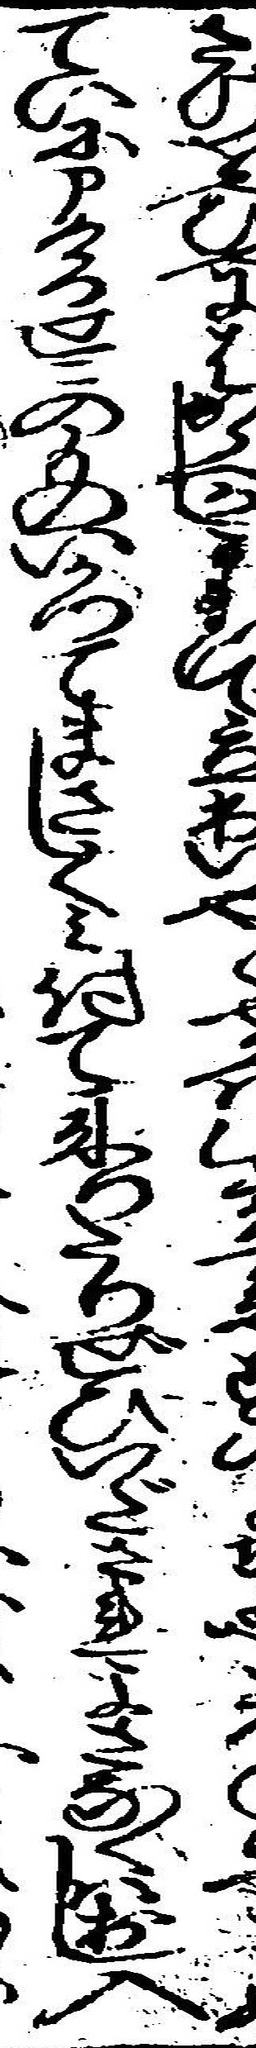ていに申けるせこのものいかつてまさしくみ付て来りたりぜひいだされよさなくはおし入
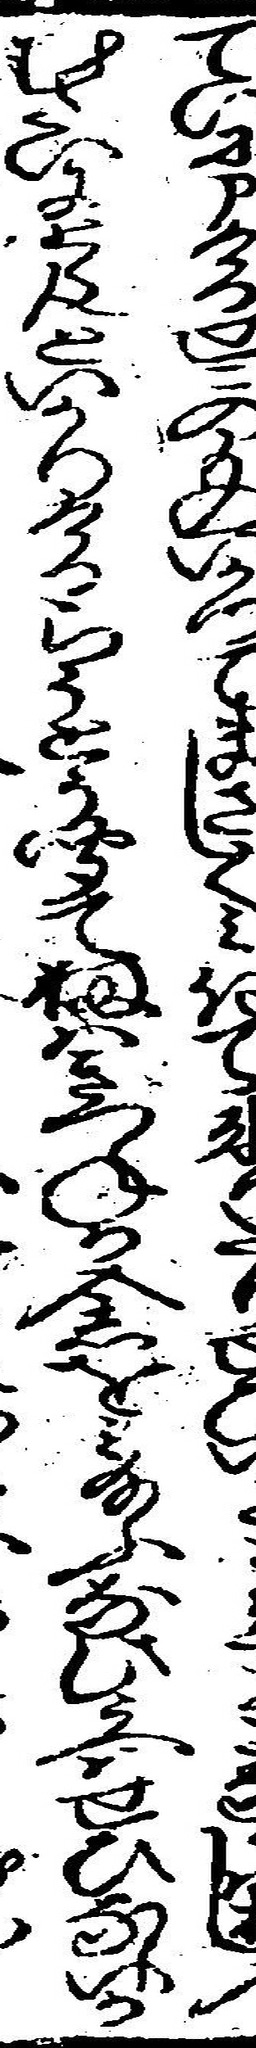むたいにとらんといかりけるらうとう聞て扨はきつねか入しをみ給ふな此うへはせひなしいか
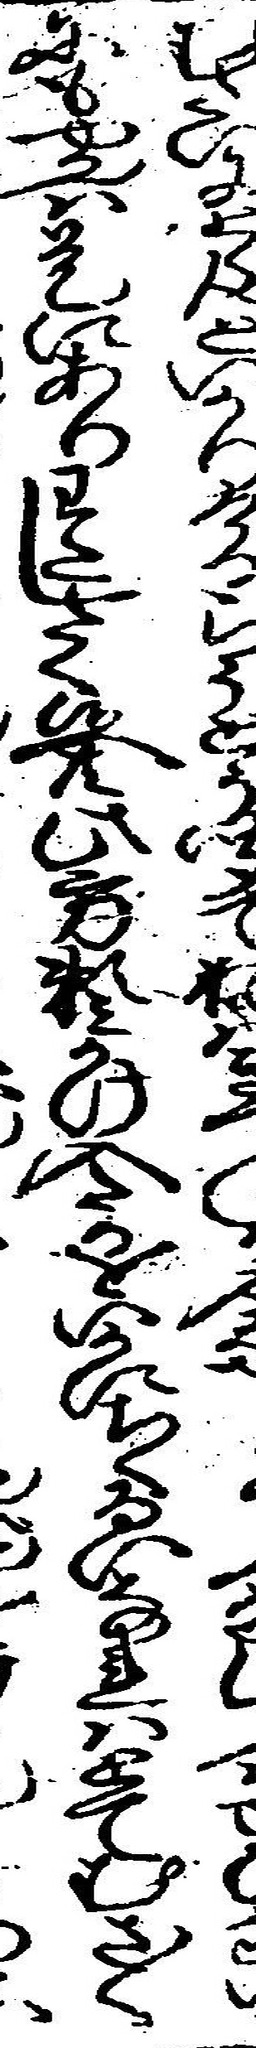にもやかんは是にありわたしたく候へ共此方頼みかけ入たるをいかにちくるいなれはとてむさ〳〵
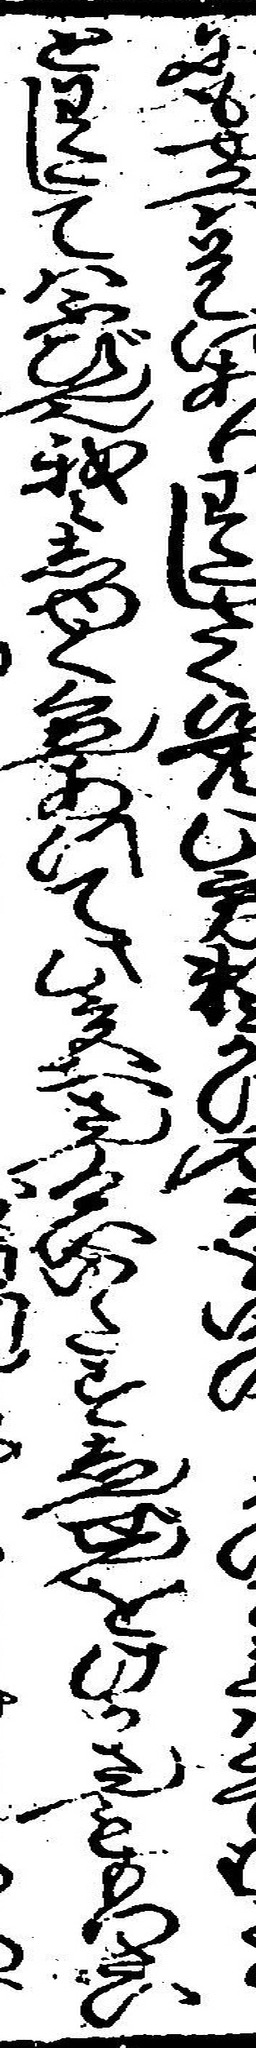とわたしてはふびん也我々しゆくくわんあつて此宮へさんけいいたすしんぜんをけかさんももつたい
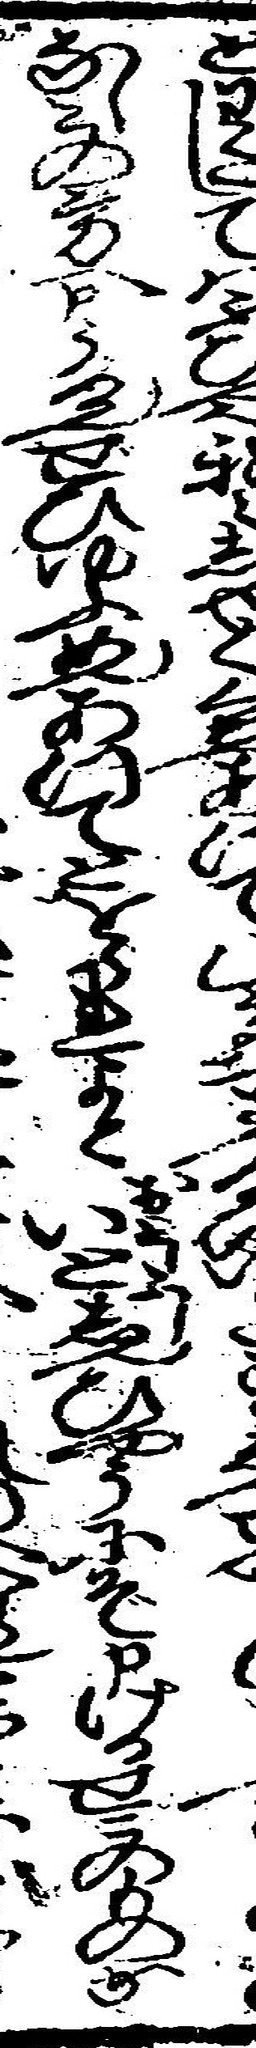なしこの方へ申うけんぜひゆふめんあつてとをられよとおとしふしいとしんひやうにぞ申けるせこのものか
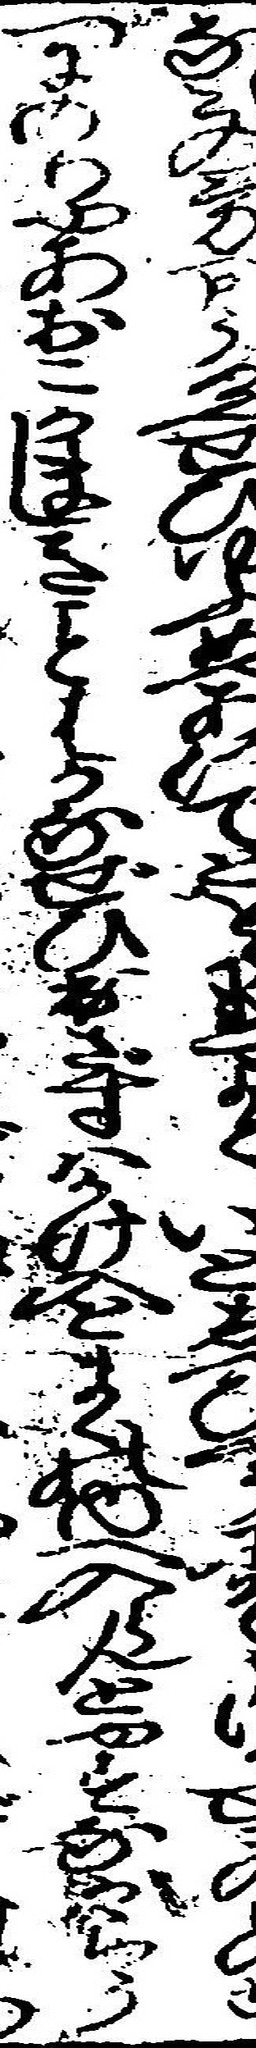づにのりやあおこかましきことはかなぜひ出さずはかけ入とまくの内へ入らんとやすなからう
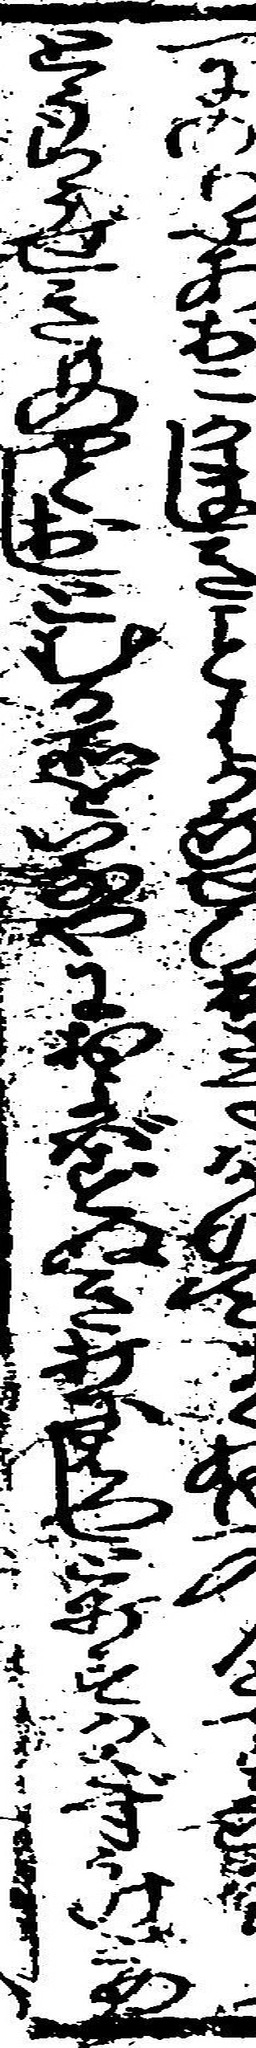とうらうせきものやとおしとむる所をいなやにおよばずぬき打にはつしと打すかさずうけとめ
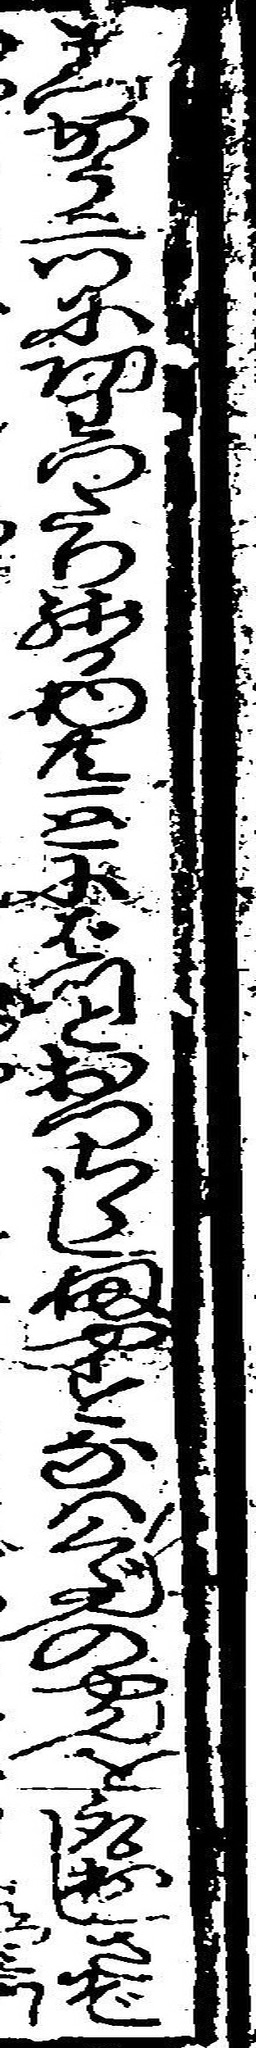まつかう二つに切わつたり残る物共一どにばつとおつちらし扨やすなはくだんのやかんを取出しさぞ
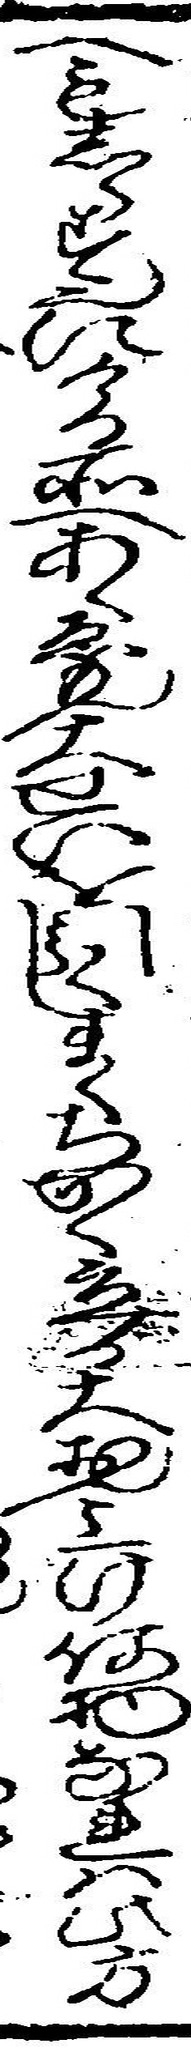へもしらす也にける所へあくゑもん大せいを引くしまくちかく立ゟ大おん上け何物なれは此方
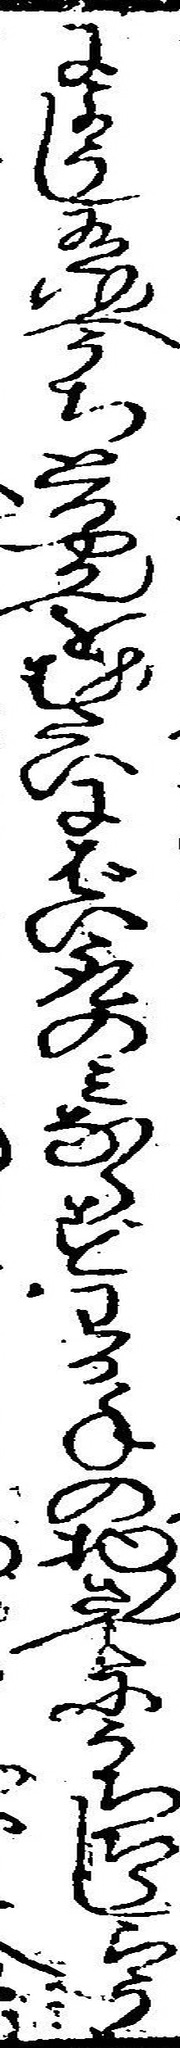にようし有ゆへうちとるやかんをむたいにばい取のみならずわかての物さんたにうちちらしらう
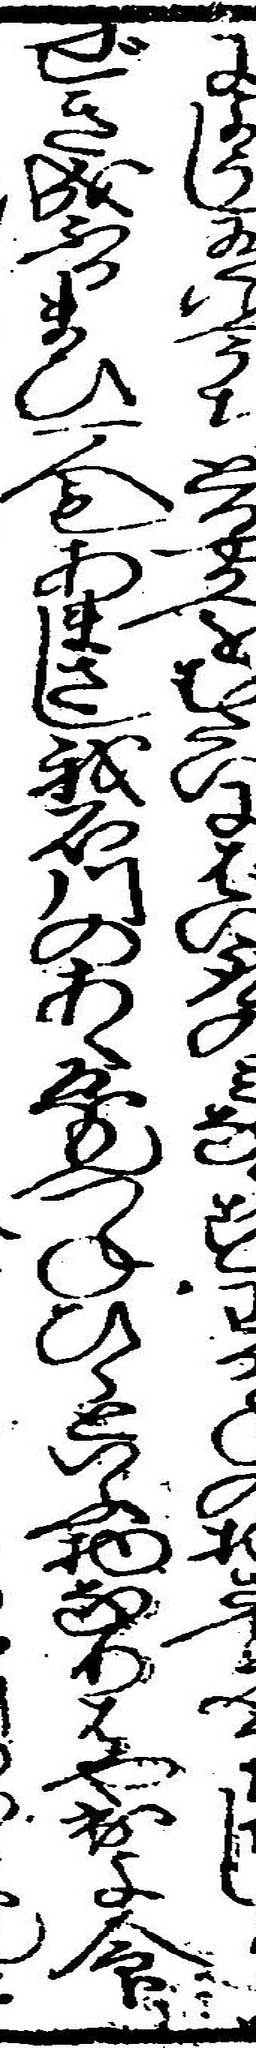ぜき成ふるまひ一人もあまさし我石川のあくゑもんつねひらといふ物なりはや出よ命
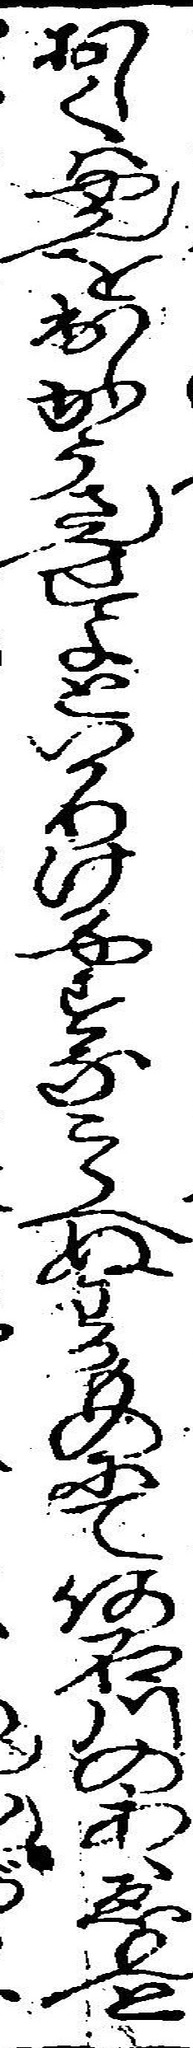おしくはやかんを出しかうさんせよといかりけるやすなこらへぬわかものにて何石川のあくゑもんと
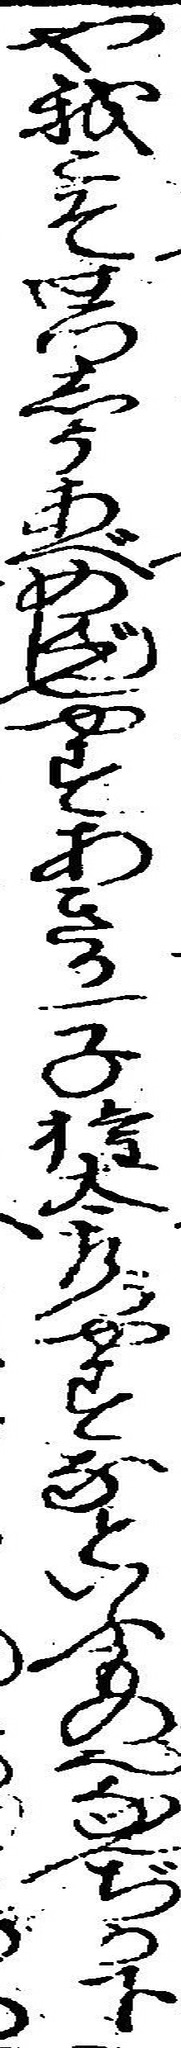や我こそせつしうあべのぐんしやすあきか一子権太左衛門やすなといふもの也なんぢか下
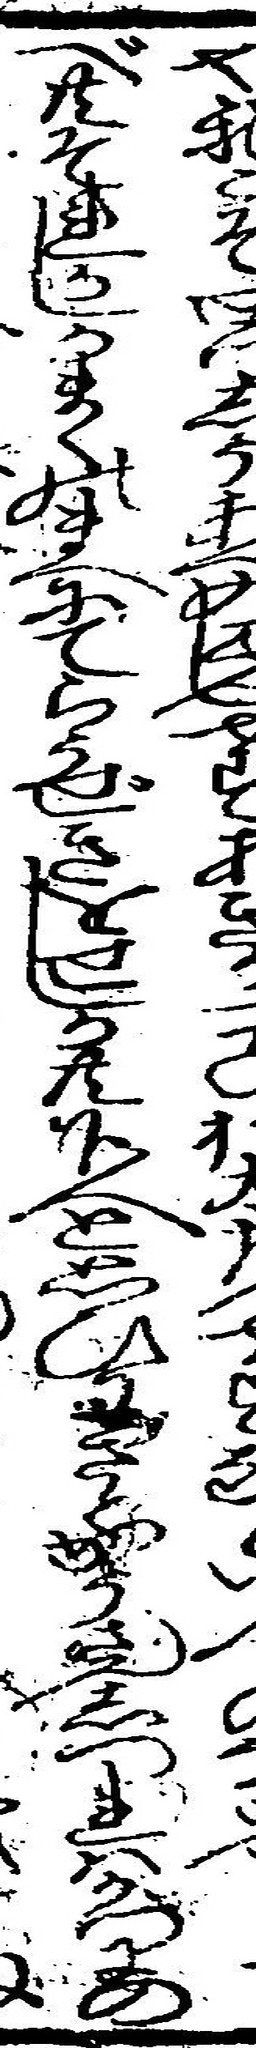べ共それかしかまくのまへにてらうぜきをせしか共下人と思ひわさとかうさんしつれはかつにの
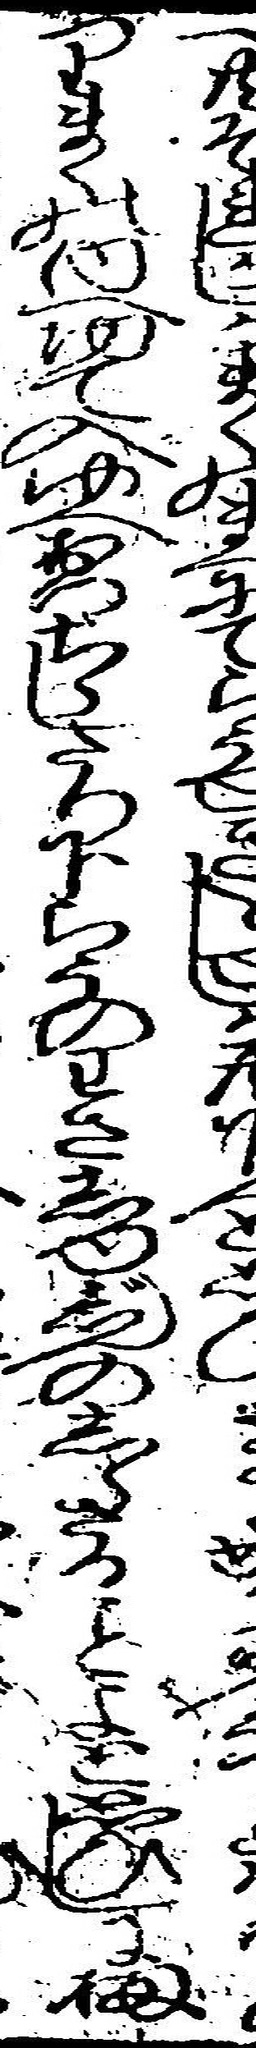りまくの内へ切て入ゆへおつちらしたり下らうのわさしゆじんのしらさることよと思ひしに扨
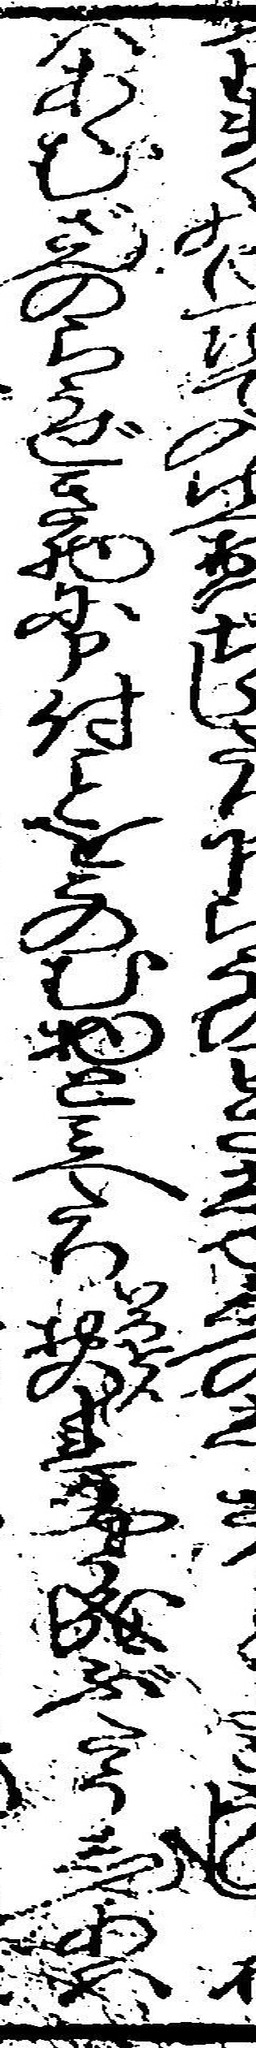はあくむざんのらうぜき物に申付ことをこのむ物とみへたりいろをんおのれかやう成ぶたうしんあは
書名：[しのだづまつりぎつね付あべの清明出生]
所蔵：東京大学総合図書館 General Library in the University of Tokyo, JAPAN
